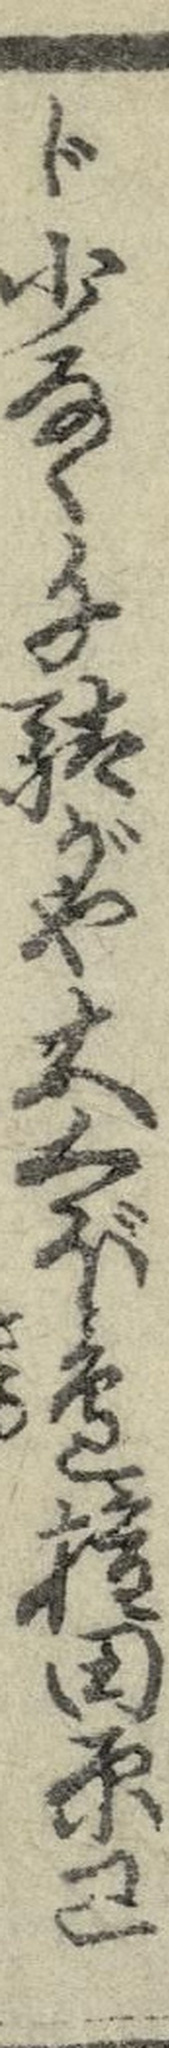じ少なく千駄がや大くぼ辺権田原辺
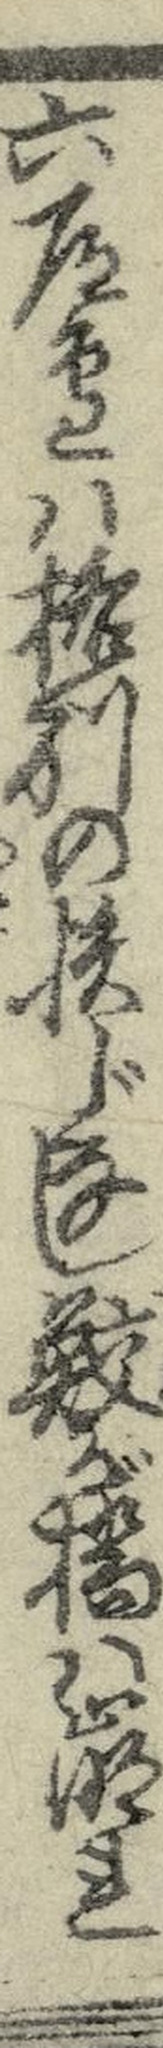六道辺は格別の損じなし鮫が橋は崩れ
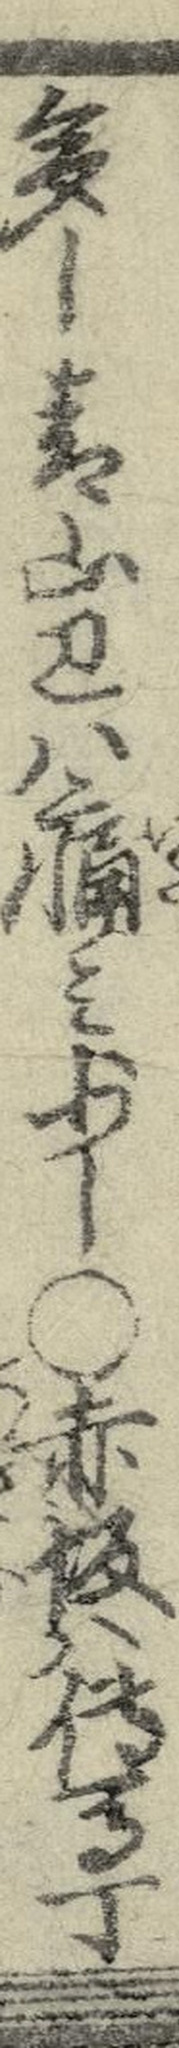多し青山辺は痛み少し〇赤坂は伝馬丁
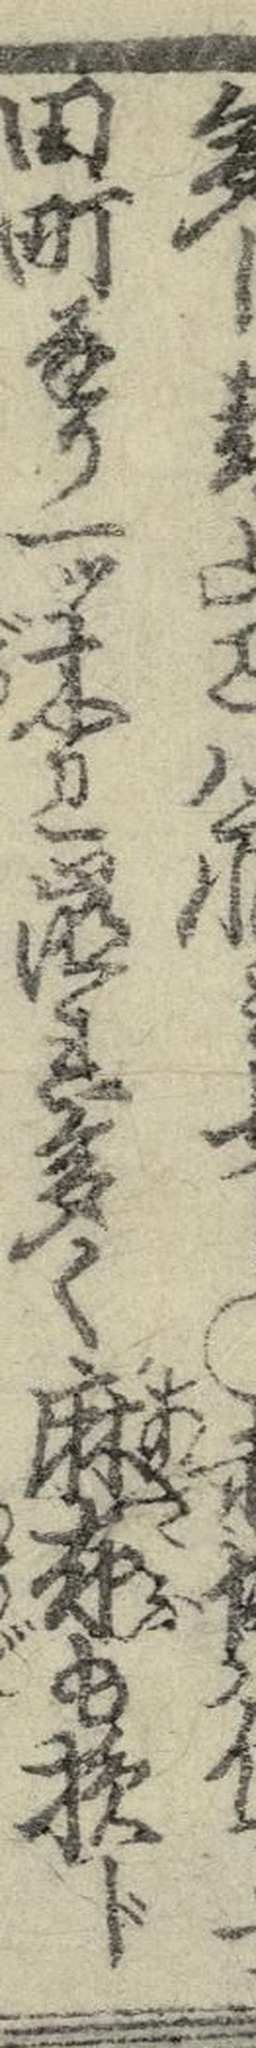田町通り一ツ木辺崩れ多く麻布も損じ
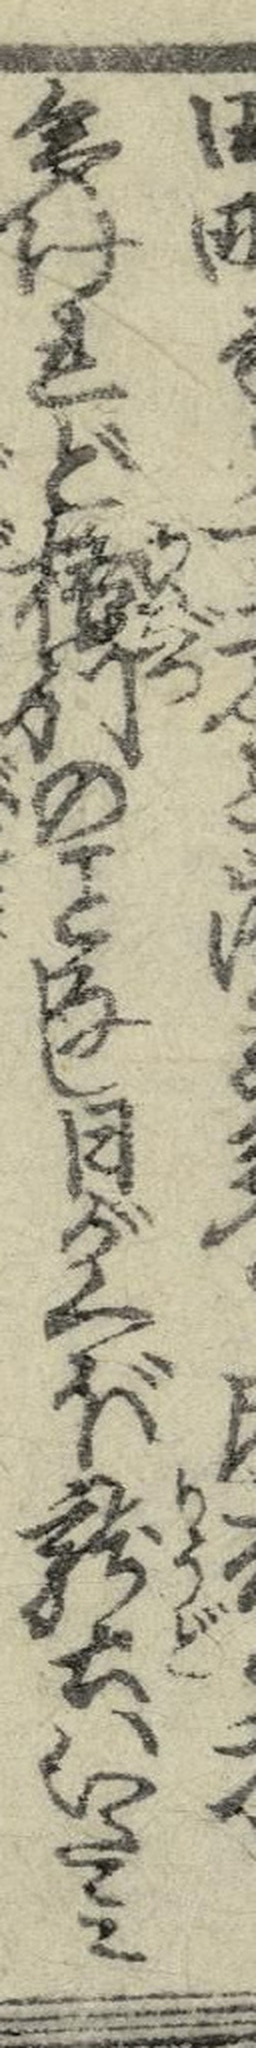多けれど格別のことなし日がくぼ龍土はいたみ
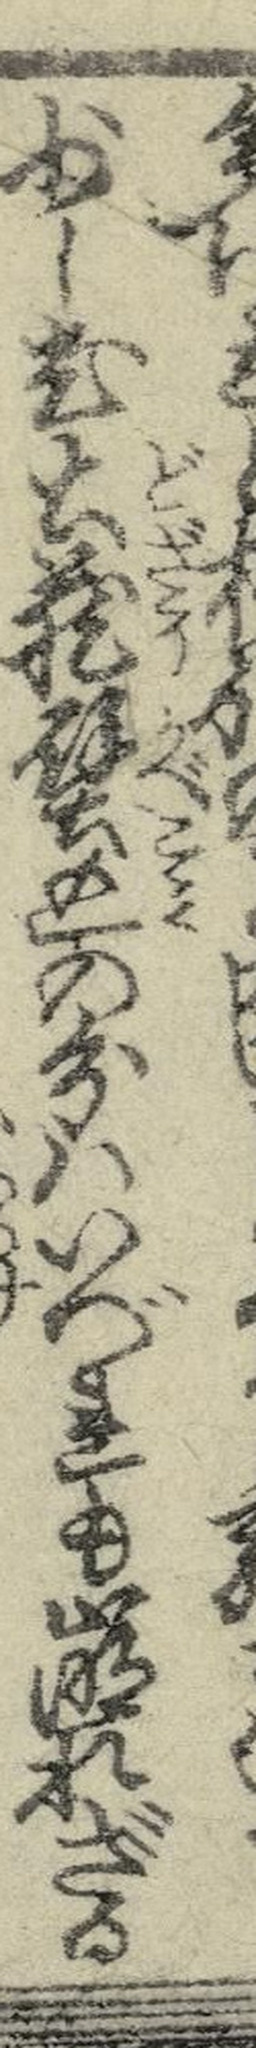少し尤土蔵壁込の分はいづれも崩れざる
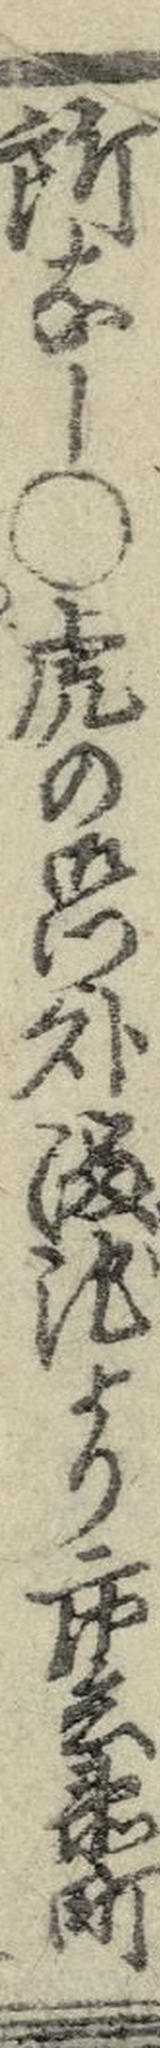所なし〇虎の御門外溜池より市兵衛町
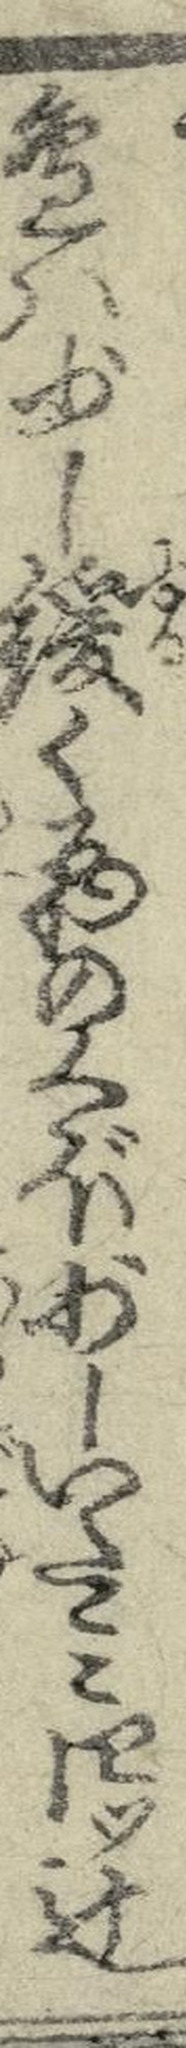辺は少し緩く西のくぼ少しいたみ四ツ辻
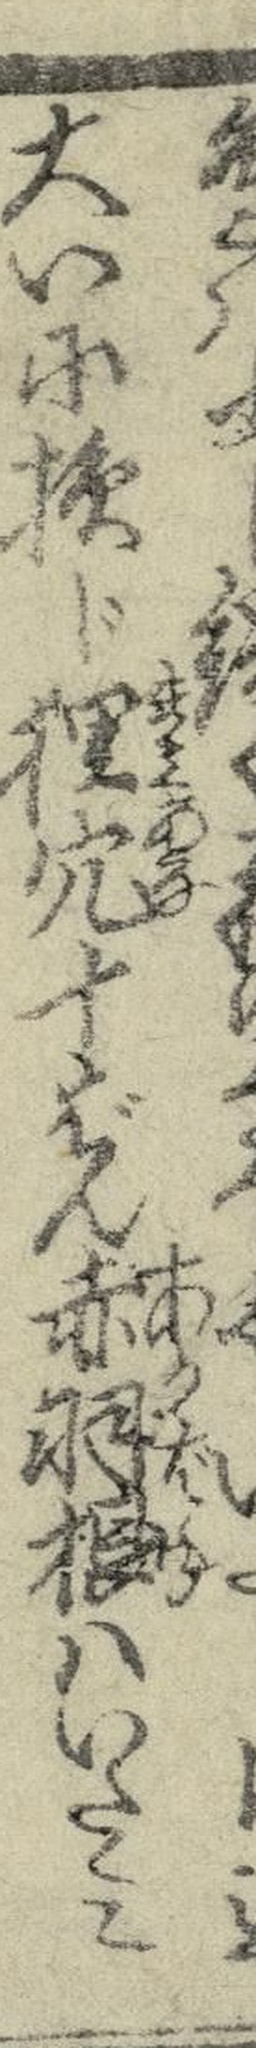大いに損じ狸穴十ばん赤羽根はいたみ
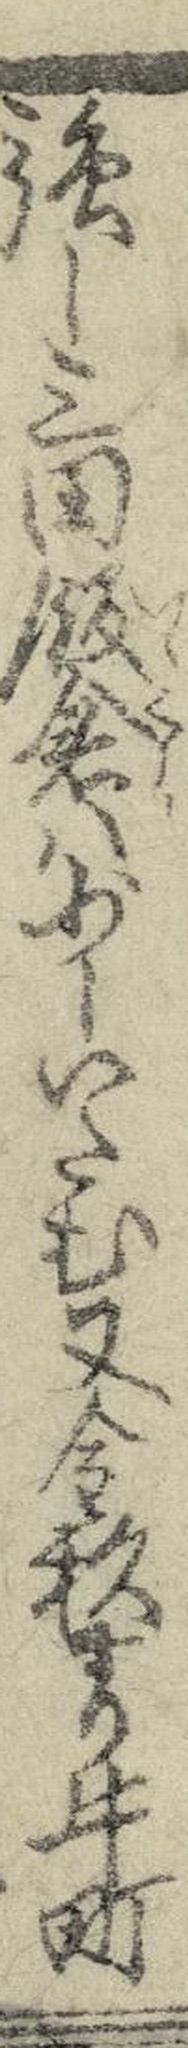強し三田飯倉は少しいたむ又金杉より牛町
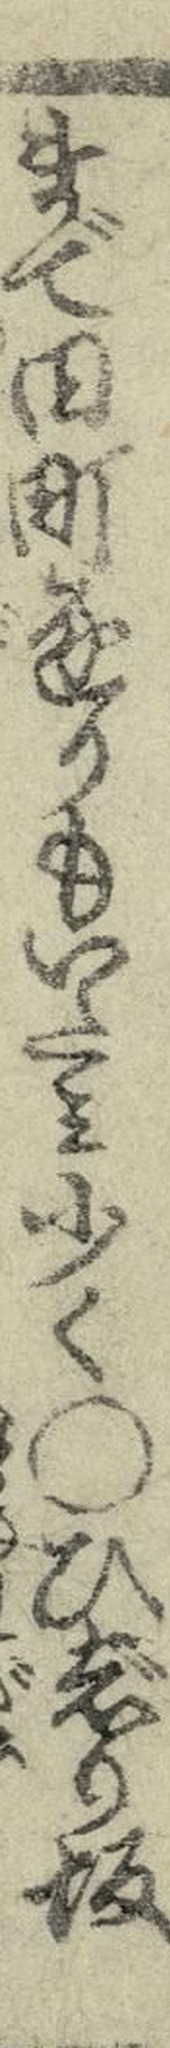まで田町通りもいたみ少く〇ひじり坂
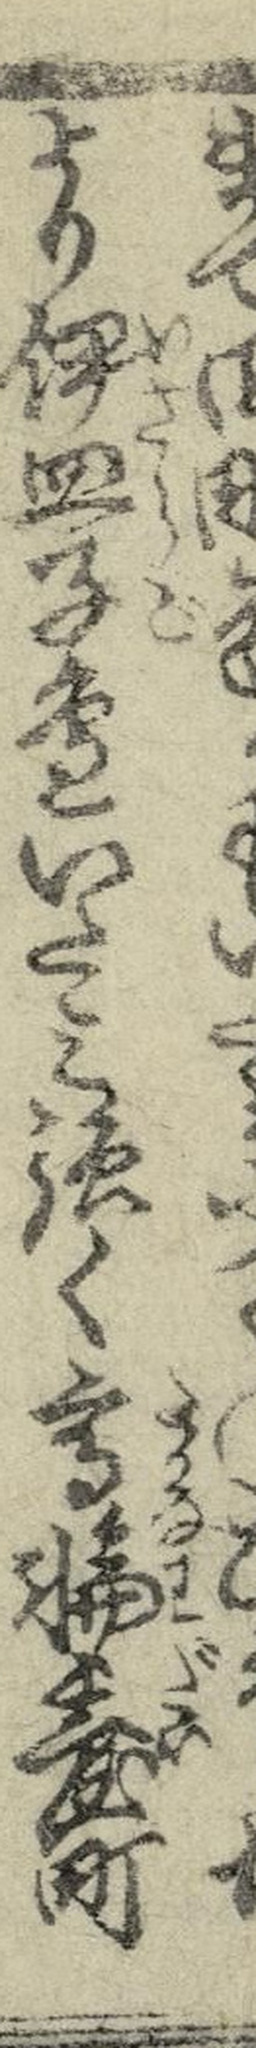より伊皿子辺いたみ強く高輪台町
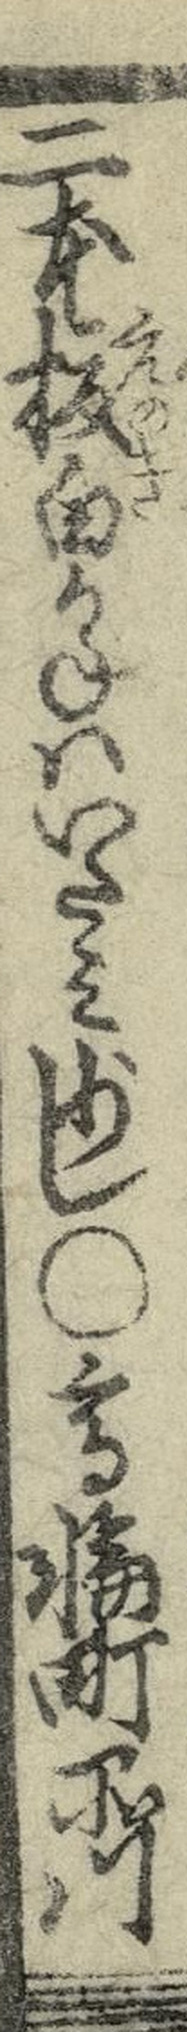二本榎白かねはいたみ少し〇高輪町品川
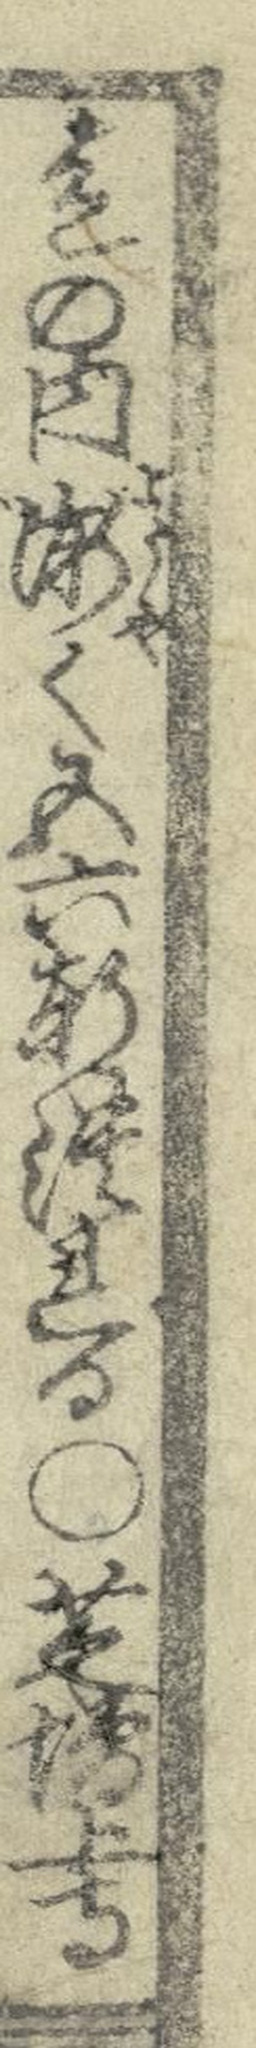辺の内漸く五六軒潰れる〇芝増上寺
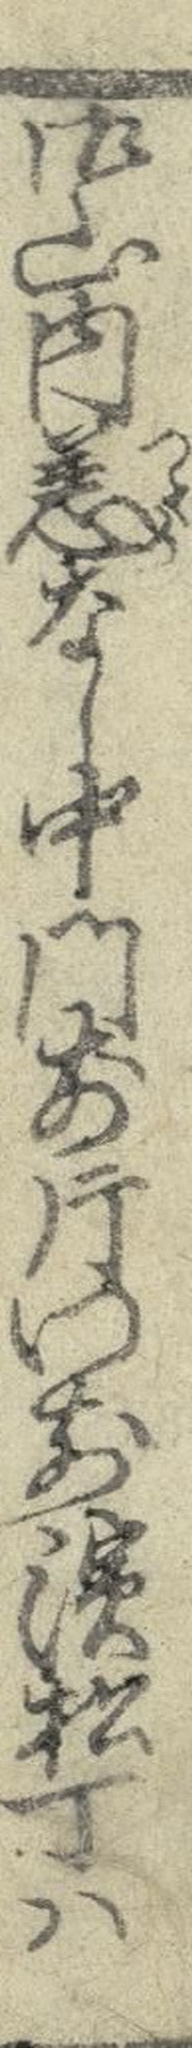御山内恙なし中門前片門前浜松丁は
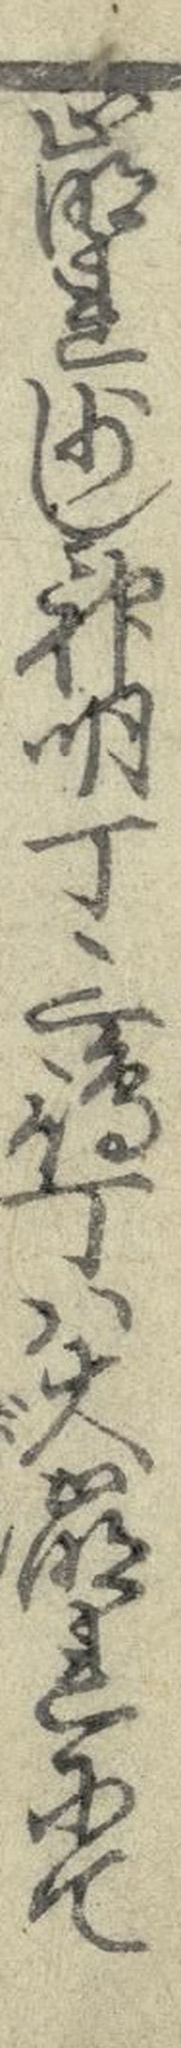崩れ少し神明丁三嶋丁は大崩れにて
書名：地震並出火細見記
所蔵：東京大学地震研究所図書室 Earthquake Research Institute Library, The University of Tokyo, JAPAN
